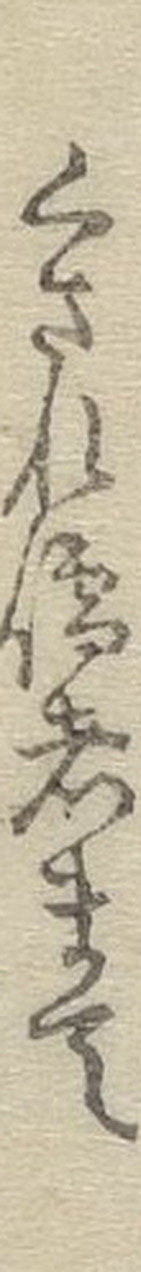くされ儒者まて
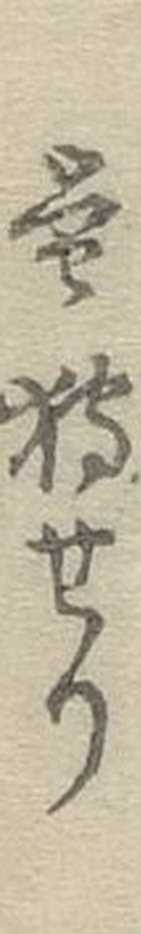蛍狩せり
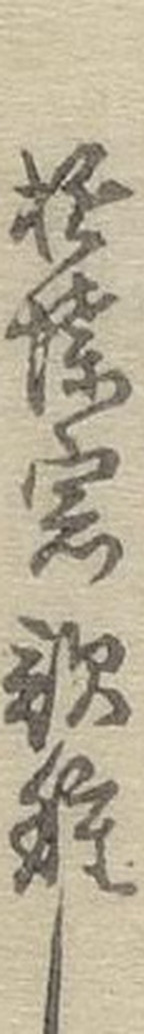遊蝶定歌雅

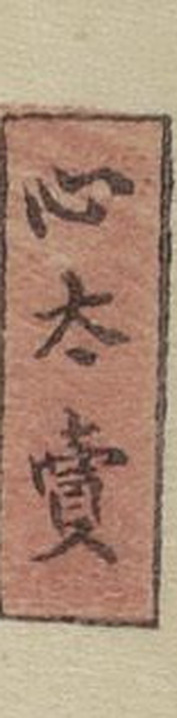心太売
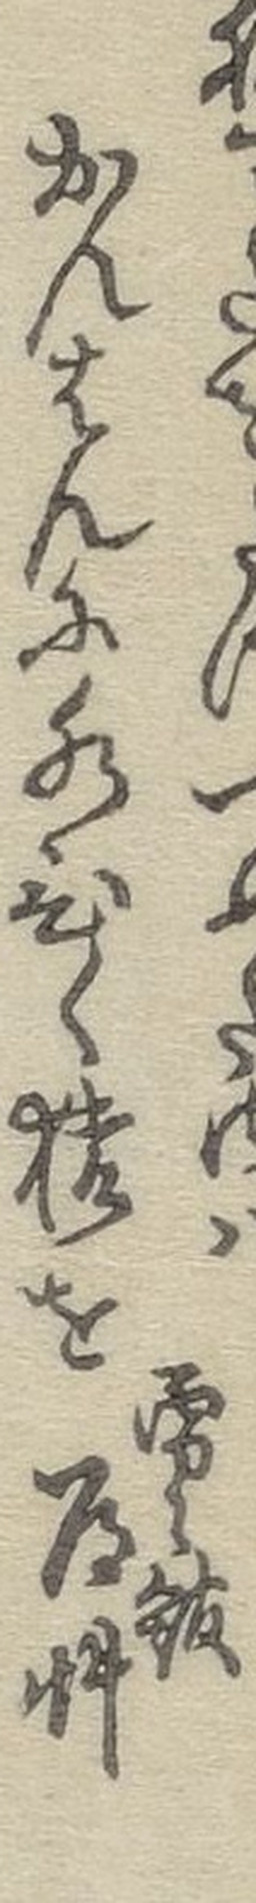かんはんに水ひく猿を道草
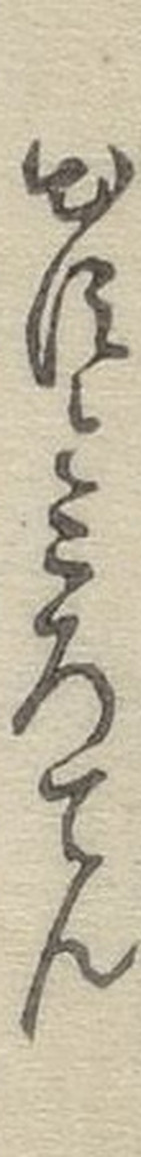出すところてん
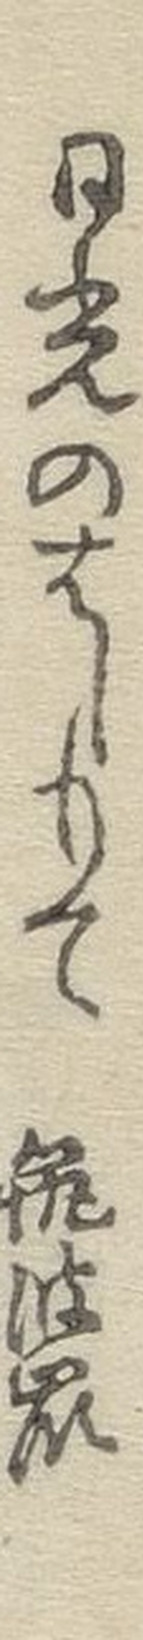日光のはしもて筑波嶺
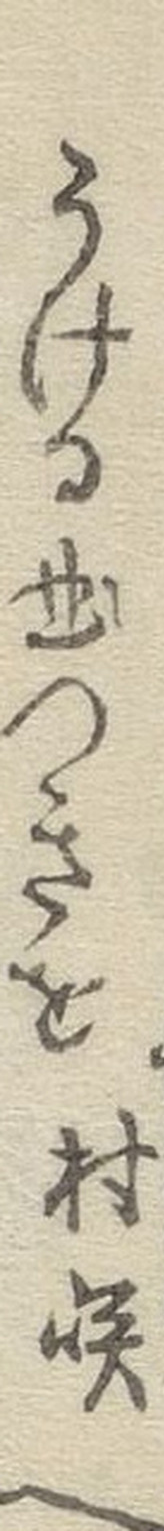うける曲つきを村咲
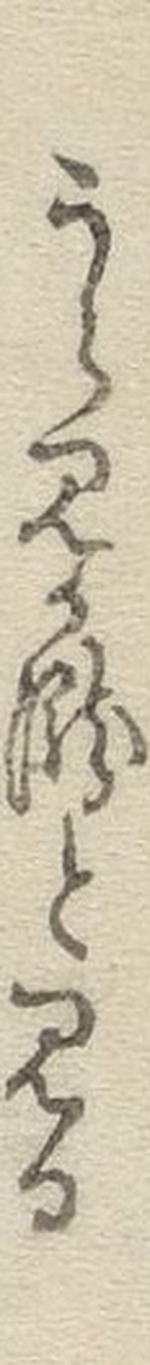うら見か瀧と見る
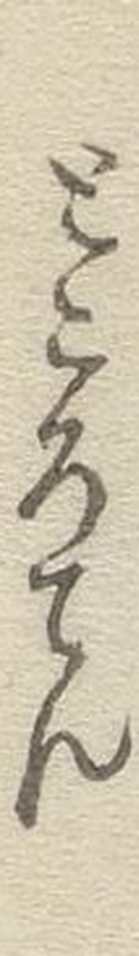ところてん
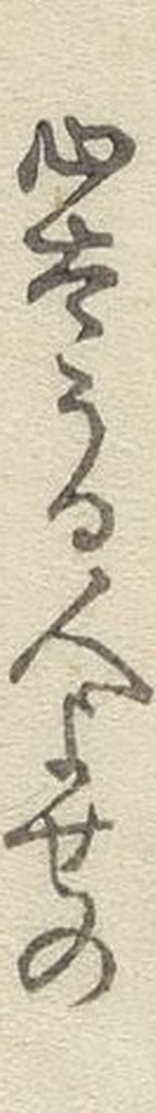心太うる人よせの
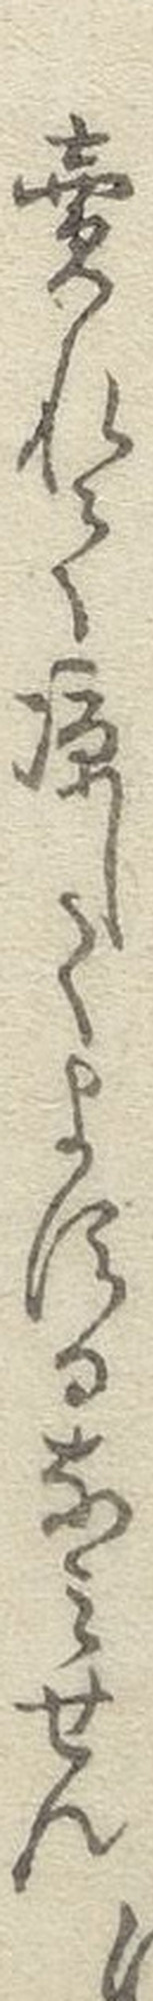売れて涼しくよするなみせん鏡月亭
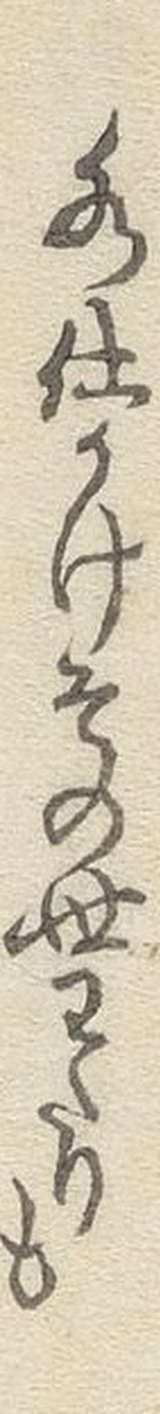水仕かけその世わたりも
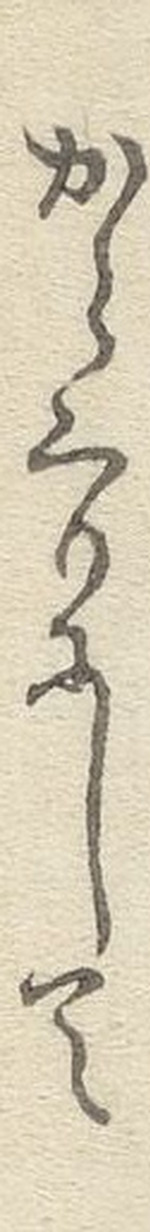からくりにして
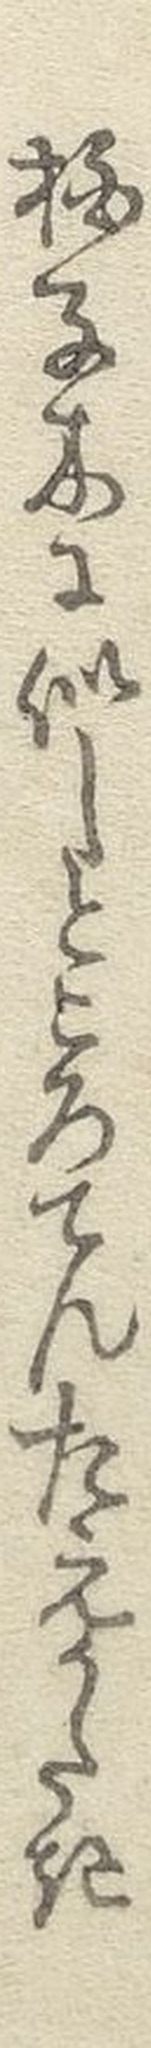拍子木に似しところてんたえかたき
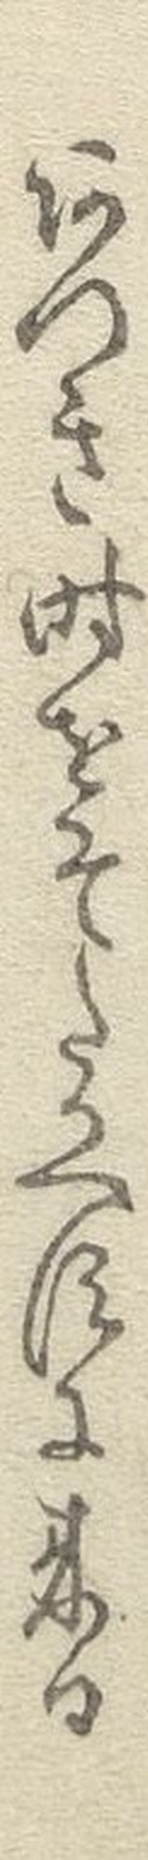あつき時をそたかえすに来る
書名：Picture Album of People with Kyōka (Light Verse) (Kyōka shiki jinbutsu 狂歌四季人物)
